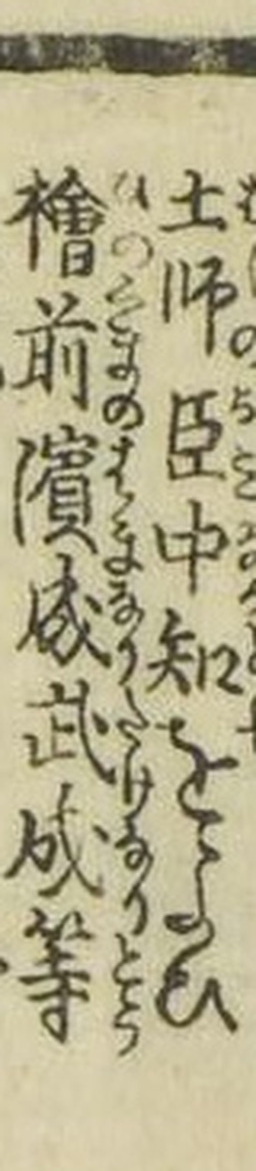檜前浜成武成等
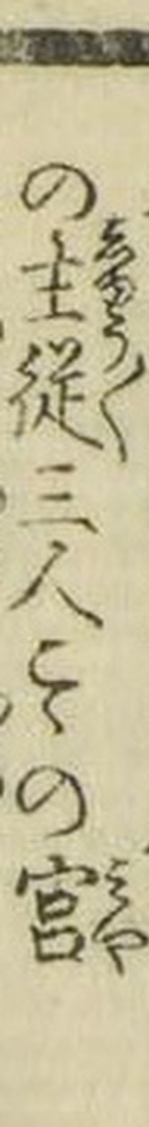の主従三人こゝの宮
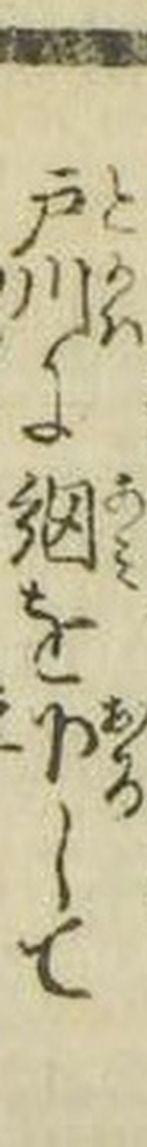戸川に網を下して
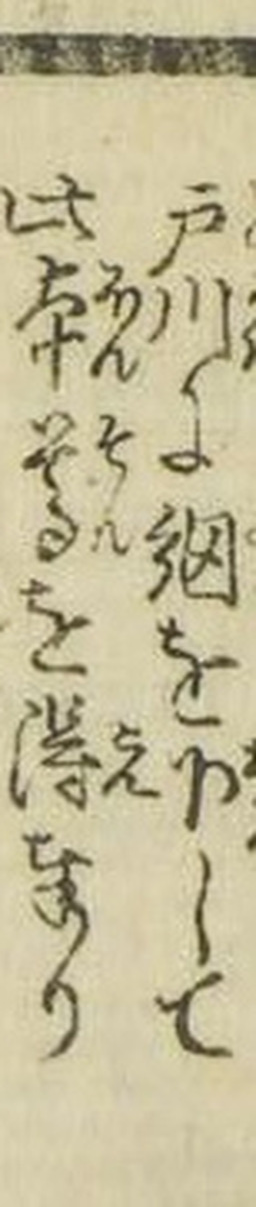此本尊を得奉り
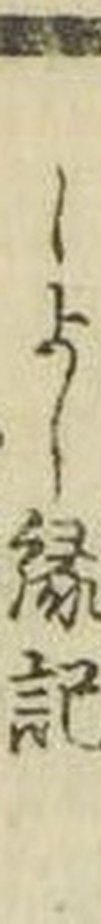しよし縁記
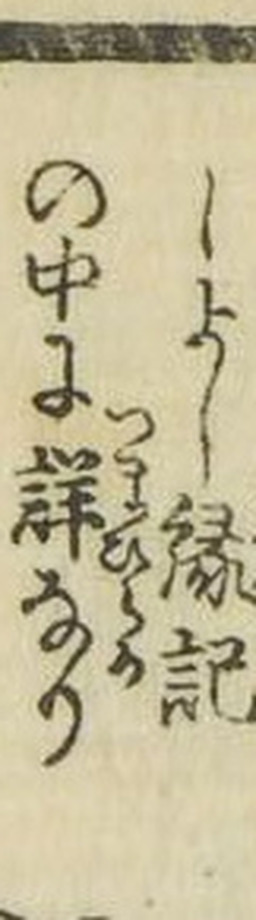の中に詳なり

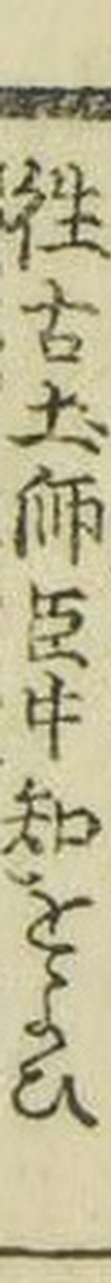往古土師臣中知をよひ
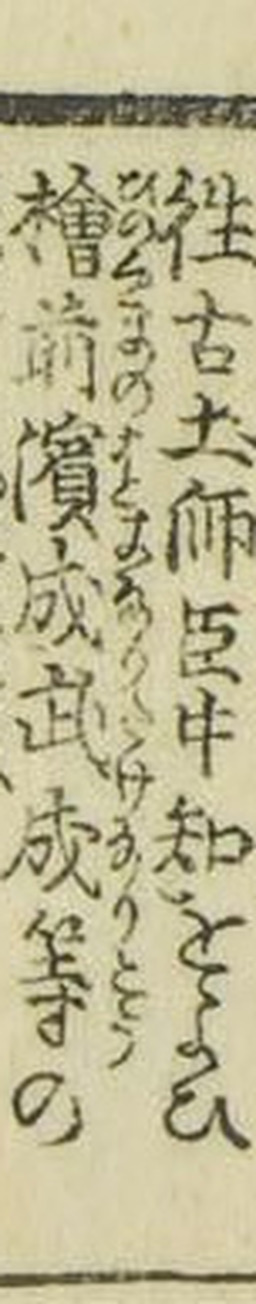檜前浜成武成等の
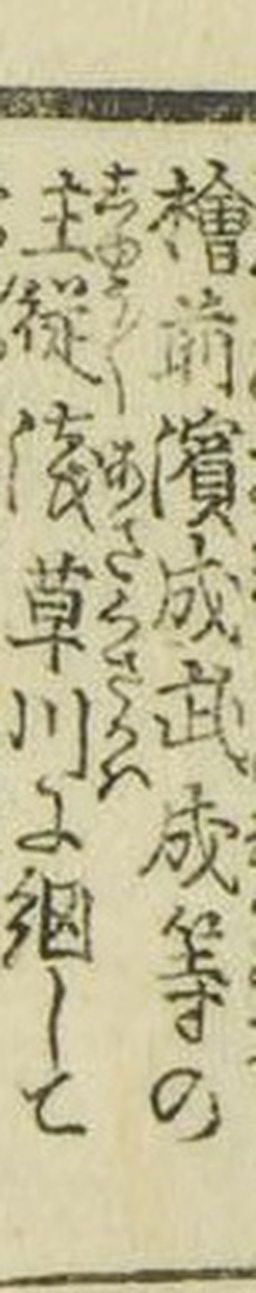主従浅草川に網して
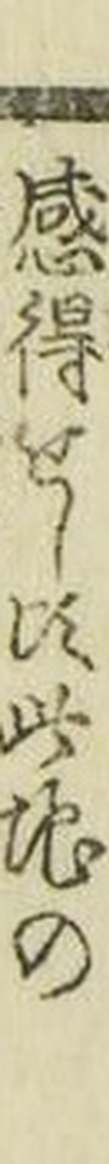感得せし頃此地の
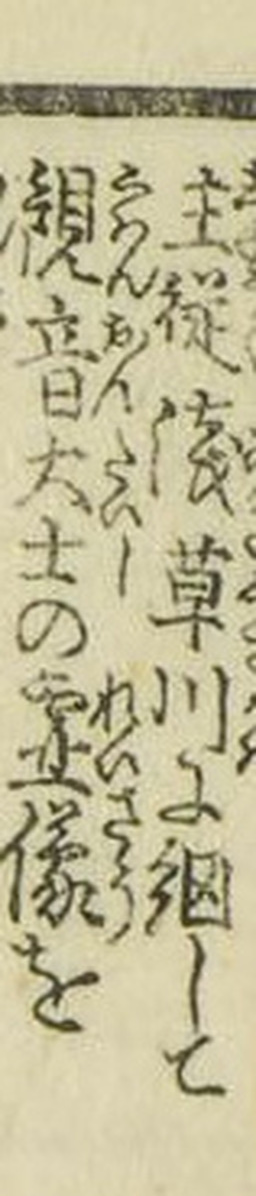観音大士の霊像を
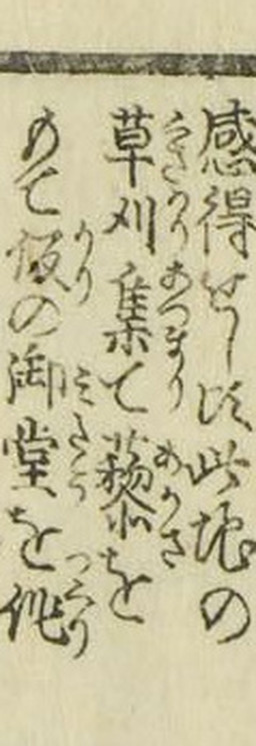草刈集て藜を
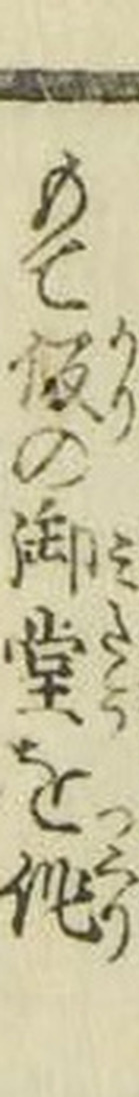もて仮の御堂を作
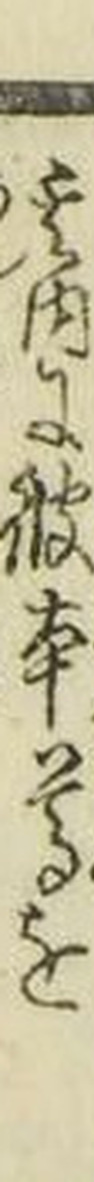其内に彼本尊を
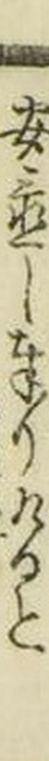安置し奉りけると
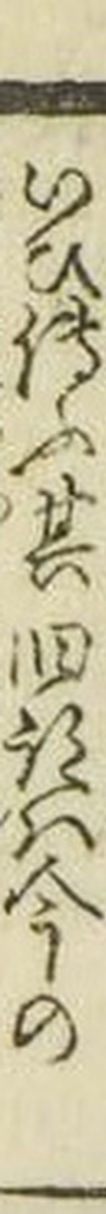いひ伝ふ其旧跡は今の
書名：江戸名所図会 20巻 巻之16
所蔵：東京学芸大学教育コンテンツアーカイブ
